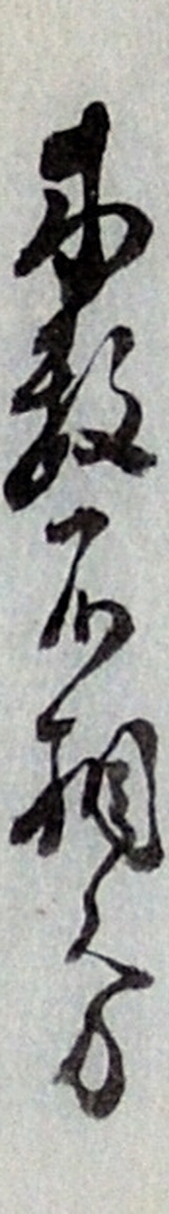木数不相分
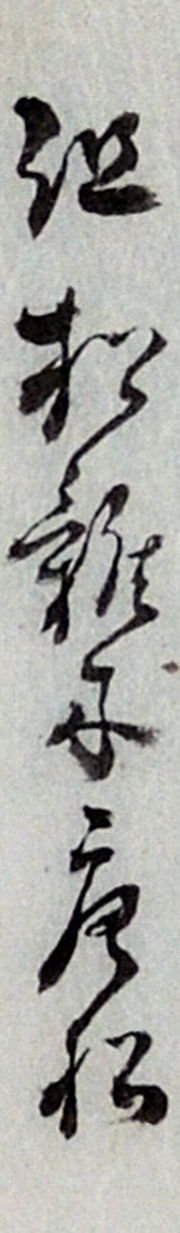但松雑木唐松
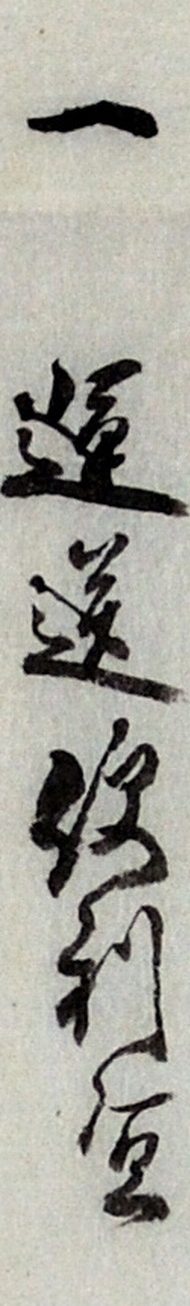一運送便利宜
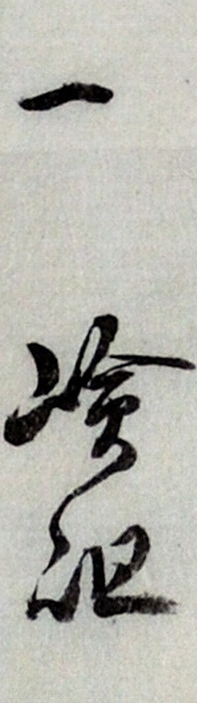一嶮岨
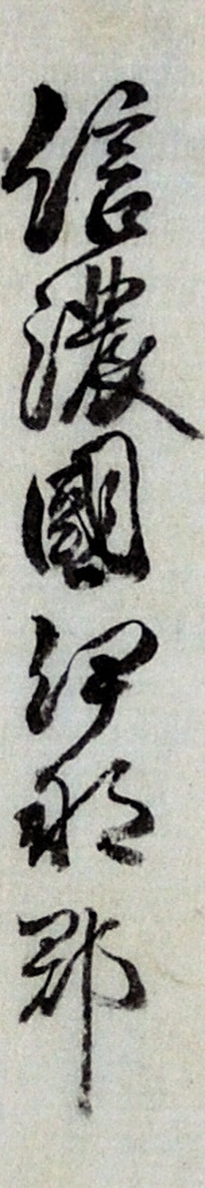信濃国伊那郡
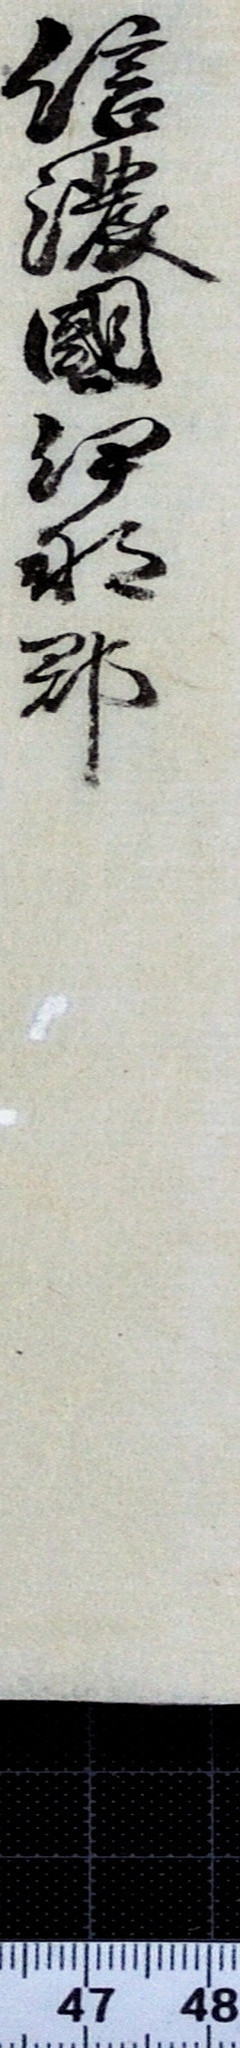信濃国伊那郡
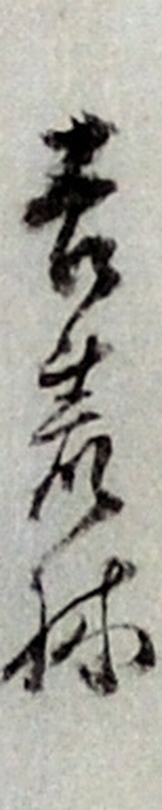吉荒林
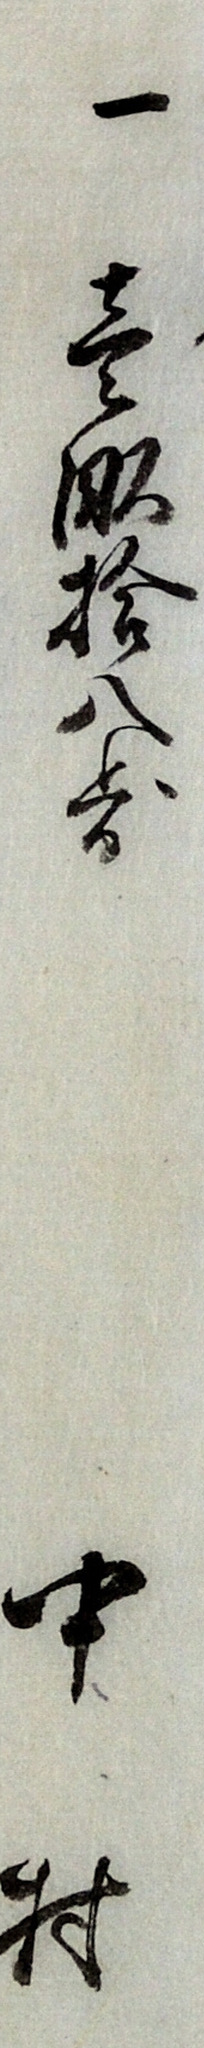一壱㽗拾八歩中村
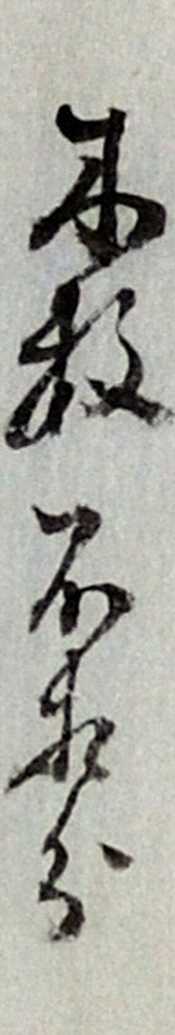木数不相分
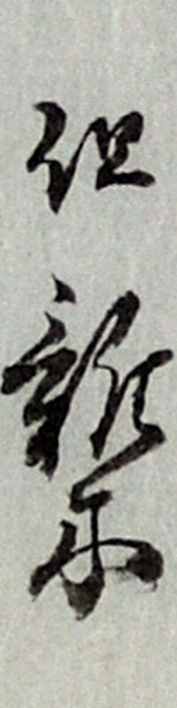但雑木
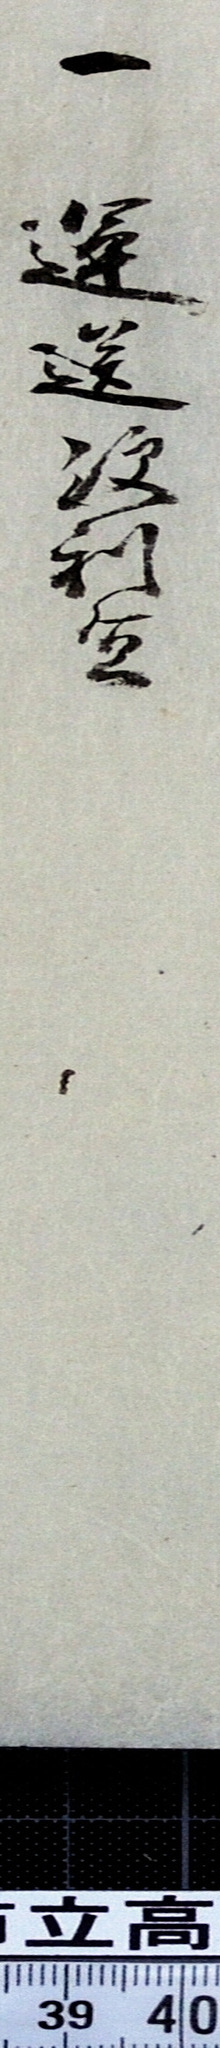一運送便利宜
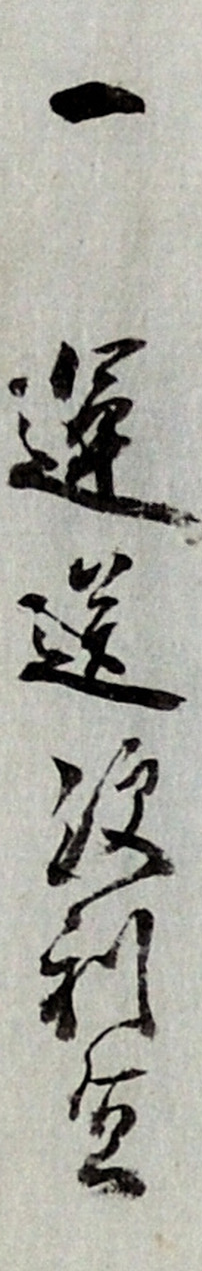一運送便利宜
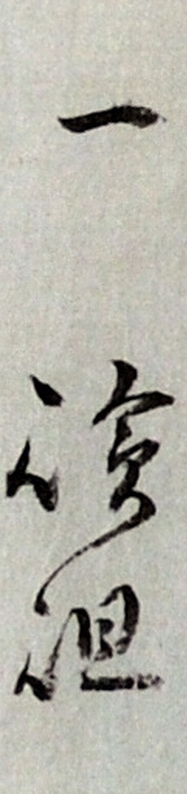一嶮岨

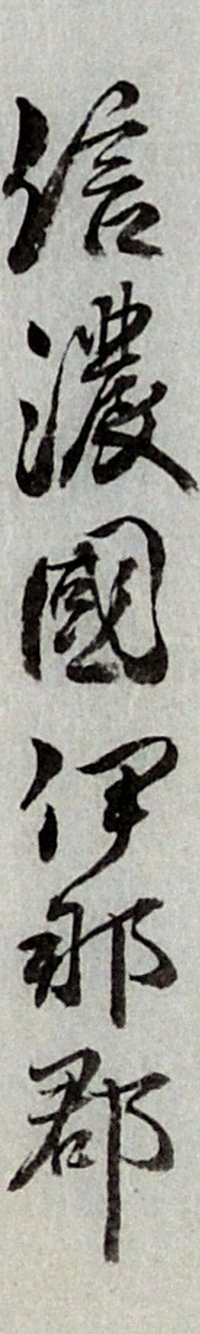信濃国伊那郡
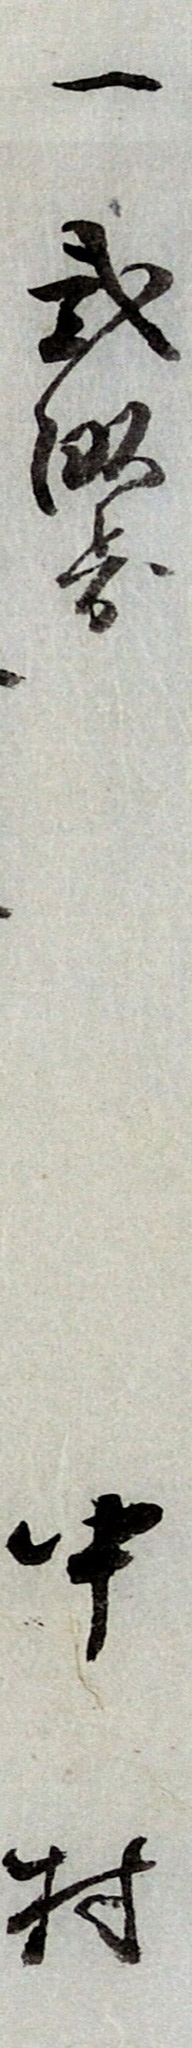一弐㽗歩中村
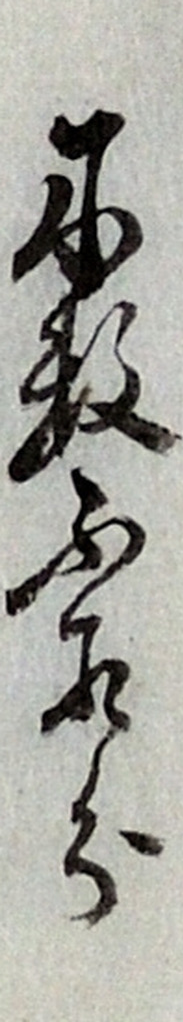木数不相分
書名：官林反別帳
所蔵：伊那市立高遠町図書館・合同会社AMANE
